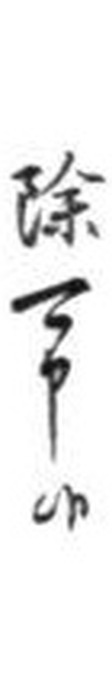除可申候
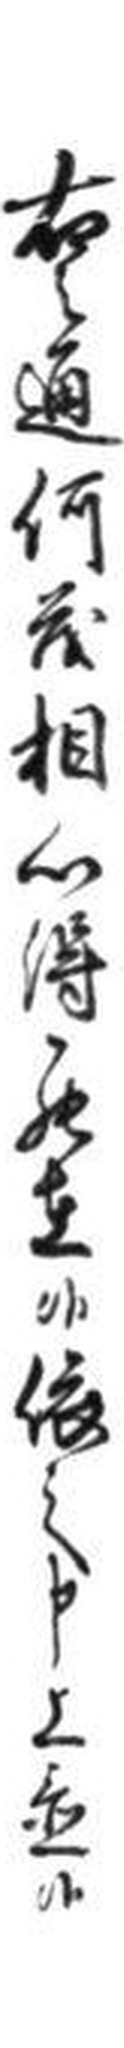右之通何茂相心得罷在候依之申上置候
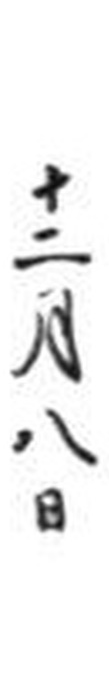十二月八日
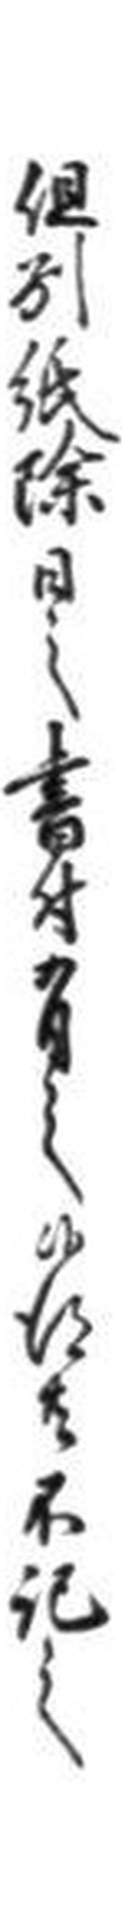但別紙除日之書付有之候得共不記之
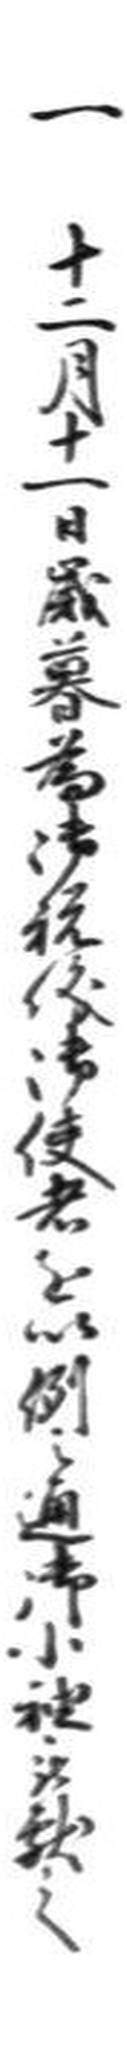一十二月十一日歳暮為御祝儀御使者を以例之通御小袖被献之
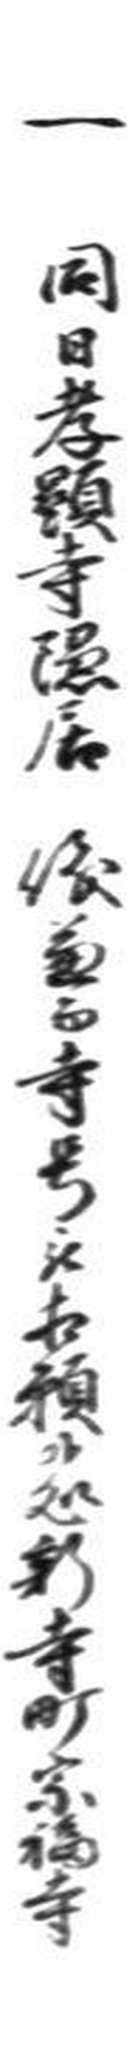一同日孝顕寺隠居儀兼而寺号被相願候処新寺町宗福寺
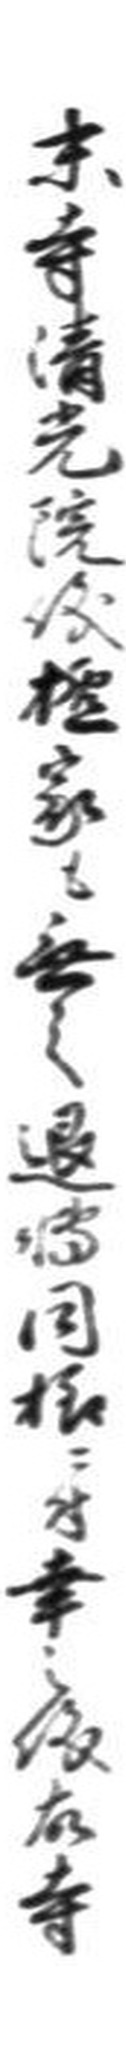末寺清光院儀檀家も無之退転同様ニ付幸之儀故寺
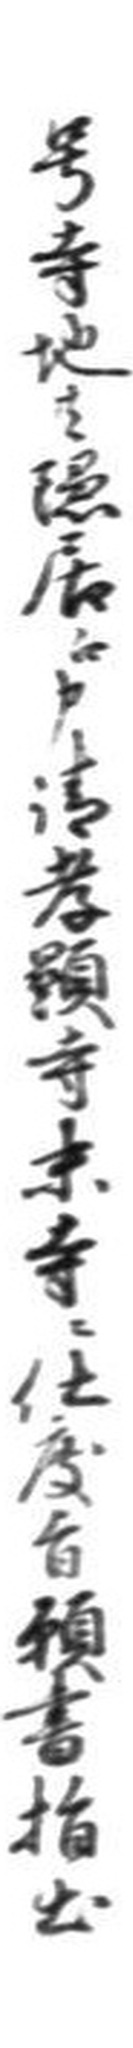号寺地共隠居江申請孝顕寺末寺ニ仕度旨願書指出
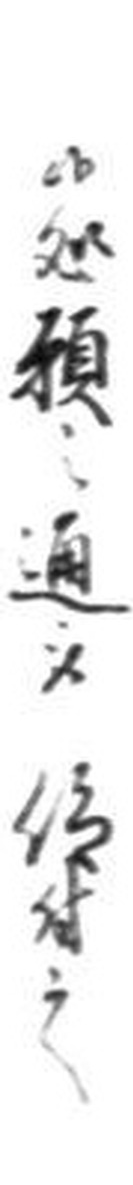候処願之通被仰付之
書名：家譜 三十二 吉邦公 従享保二年到享保三年
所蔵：福井県文書館 Fukui Prefectural Archives
